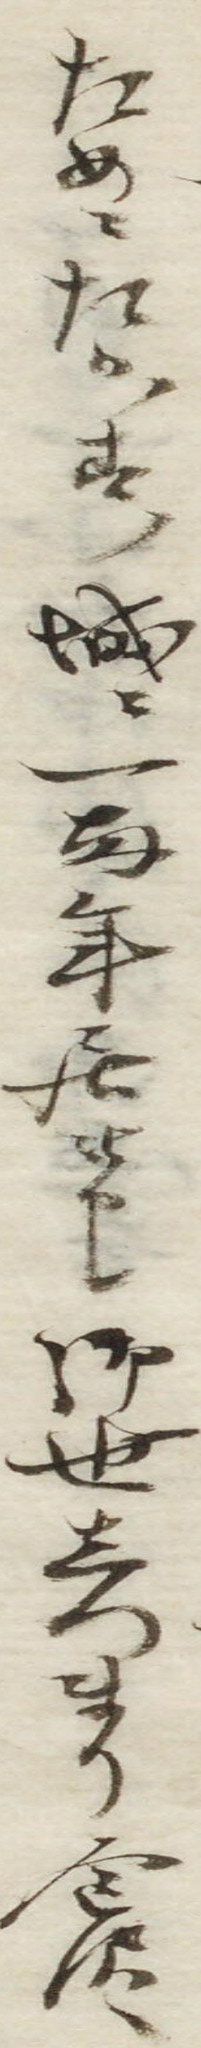ためにたかノすノ城に一両年居被申候御世しつまり金沢へ
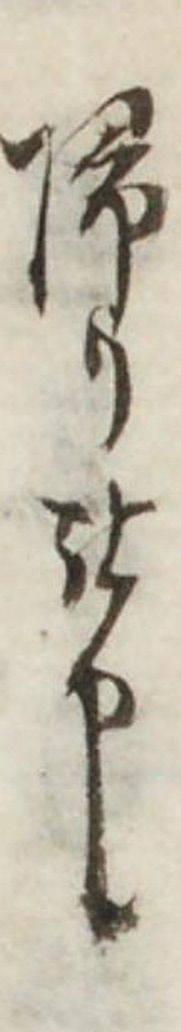帰り被申候
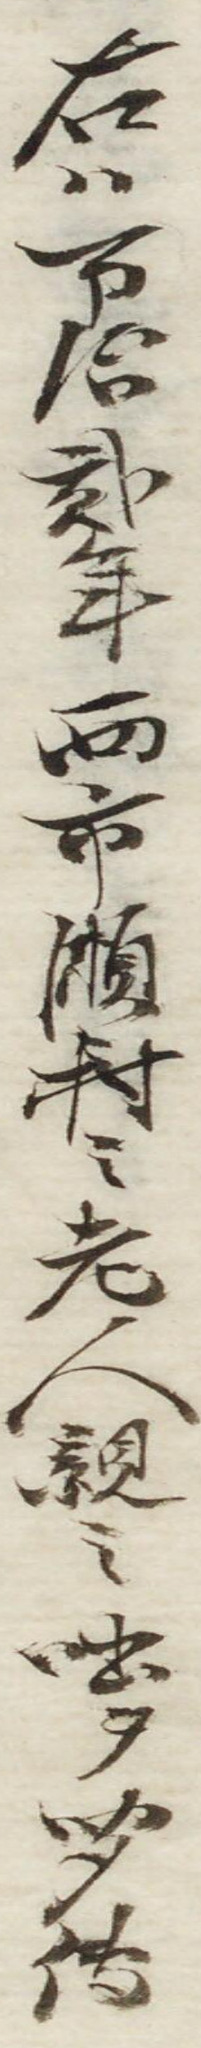右は万治弐年西市瀬村之老人親之咄を聞伝
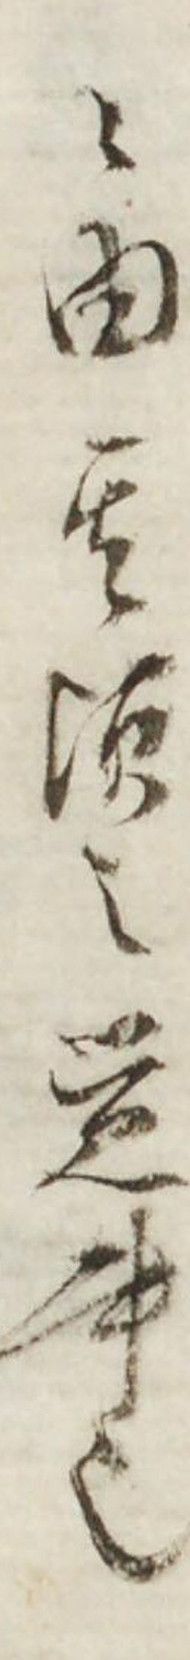之由其頃之覚事也
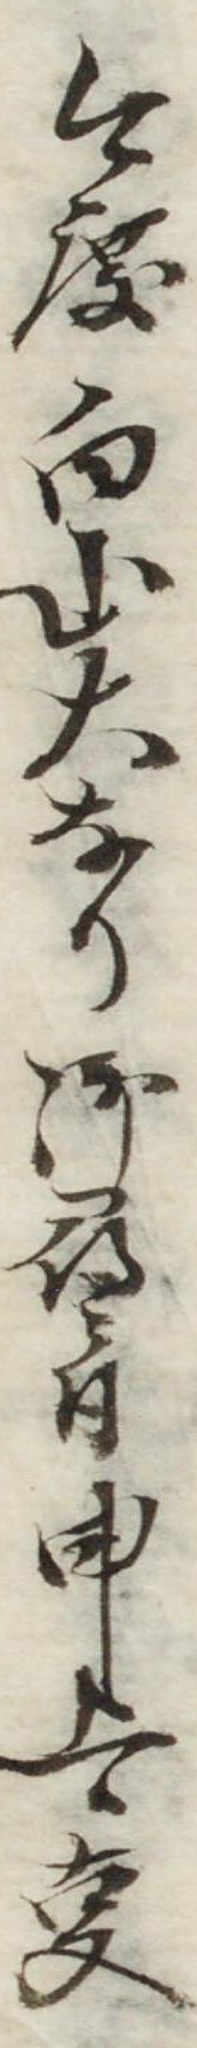今度白山大なり御尋に付申上候事
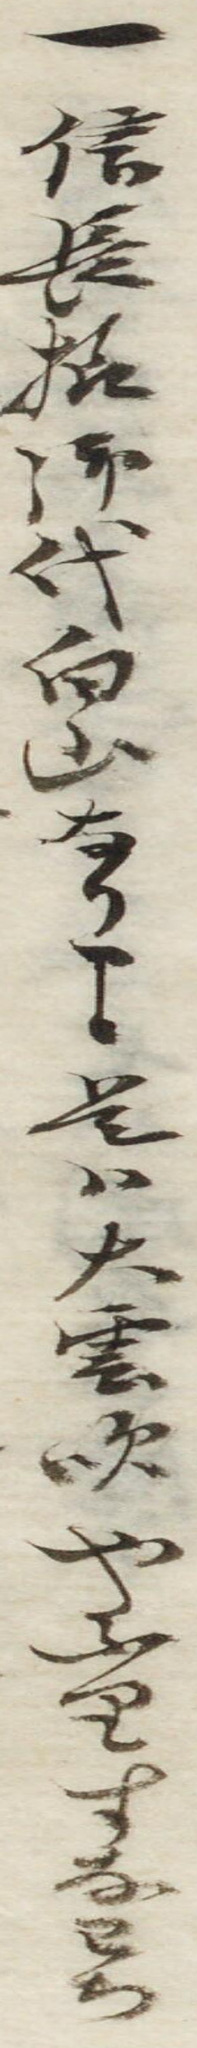一信長様御代白山なり申候是は大雲吹やふりすなわち
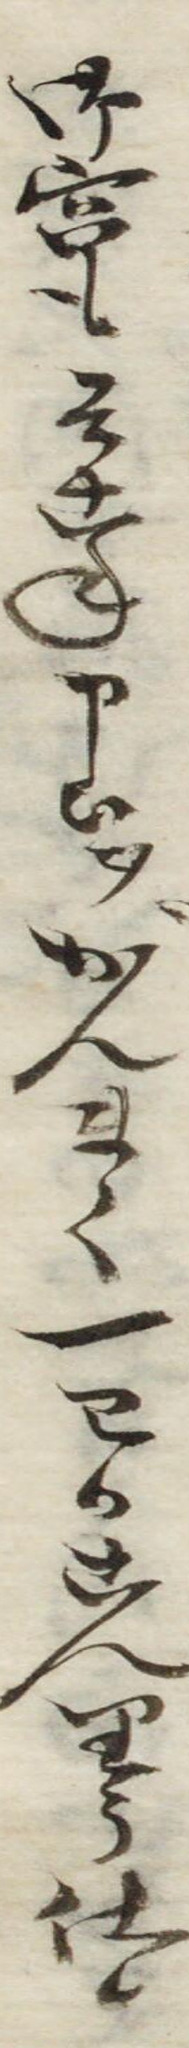御宮もそこね申候をがんなく一わかこんりう仕候
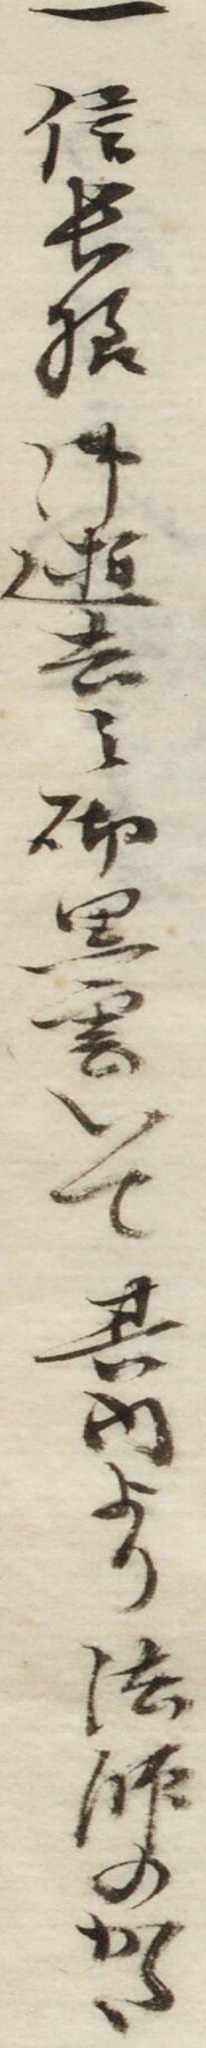一信長様御逝去之砌黒雲いて其内より法師のかた

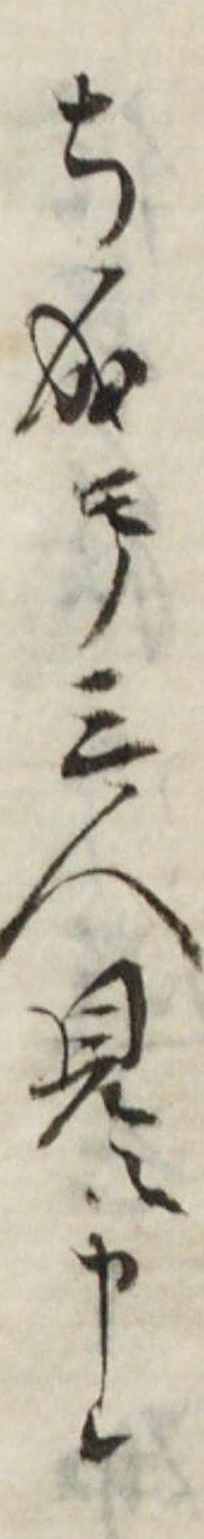ち成もの三人見え申候
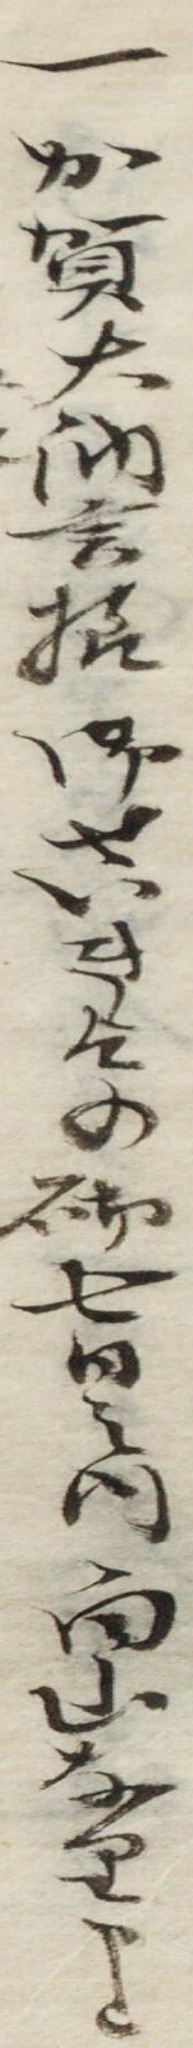一加賀大納言様御せいきよの砌七日之内白山なり申候
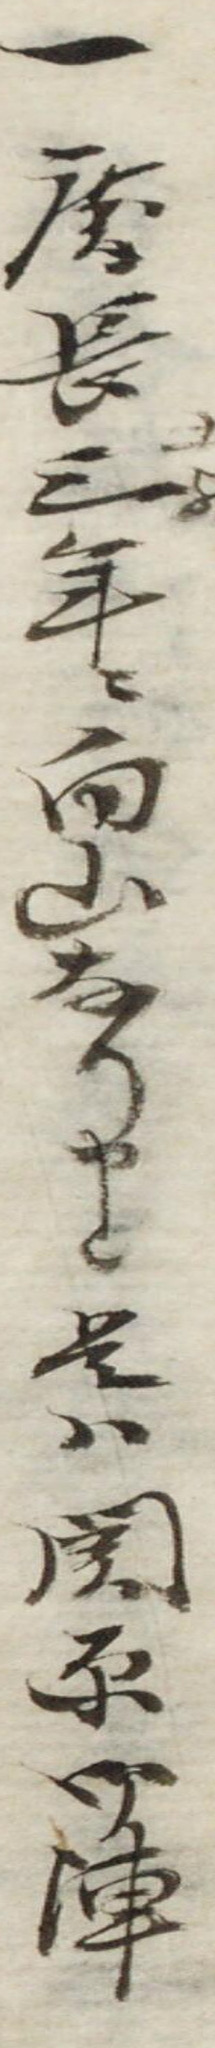一慶長三年に白山なり申候是は関原御陣
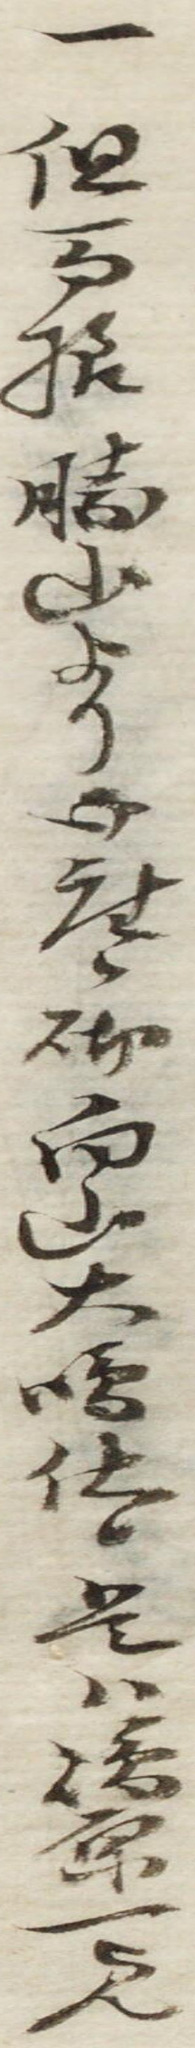一但馬様勝山より御座候砌白山大鳴仕候是は嶋原一らん
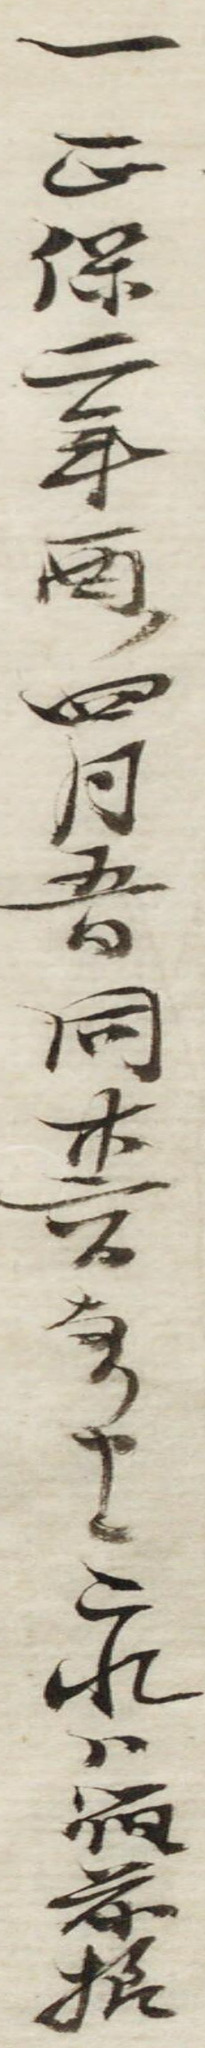一正保二年酉ノ四月五日同廿二日なり申候これは筑前様
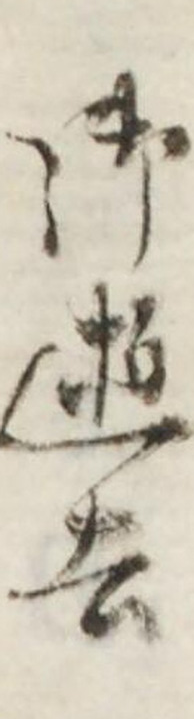御逝去
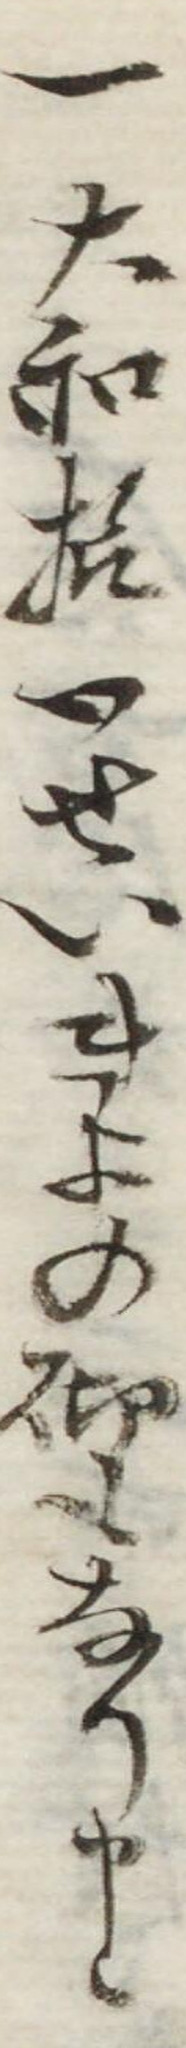一大和様御せいきよの砌もなり申候
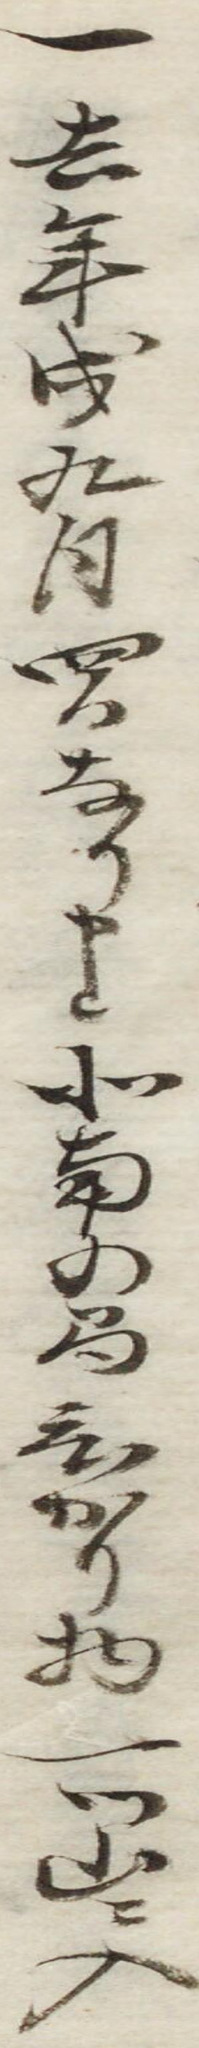一去年戌九月四日なり申候北南の間ひかり物一つ山に入
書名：古老旧聞紀略
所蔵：Ishikawa Prefectural Library
